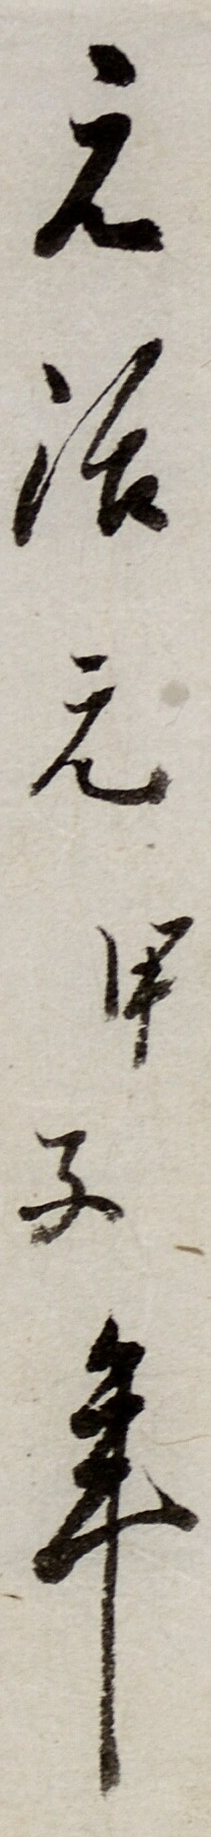元治元甲子年
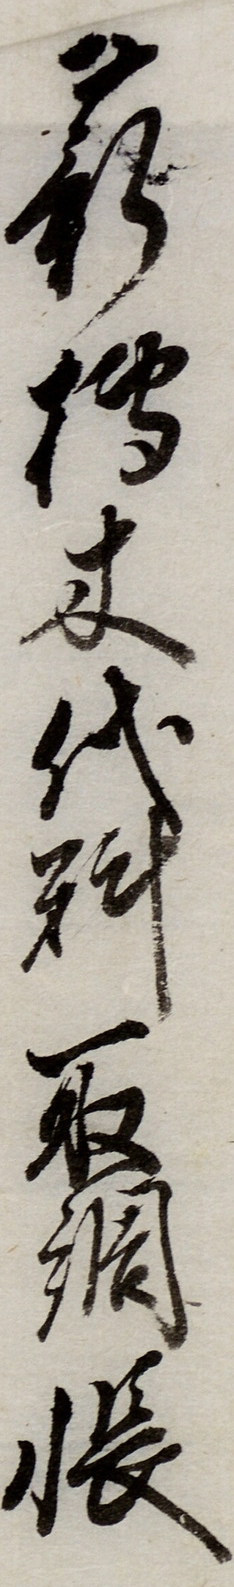薪槫木代料取調帳
